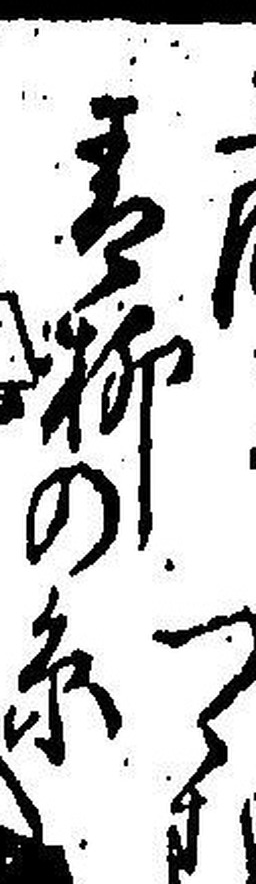青柳の糸
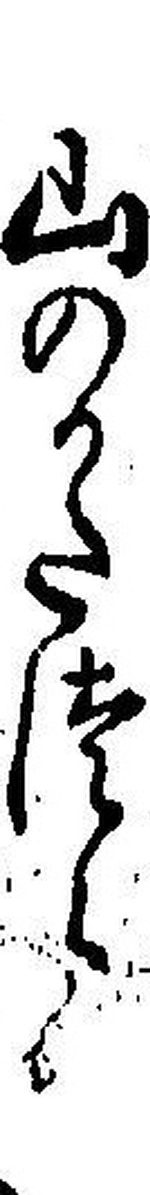山のかたつら
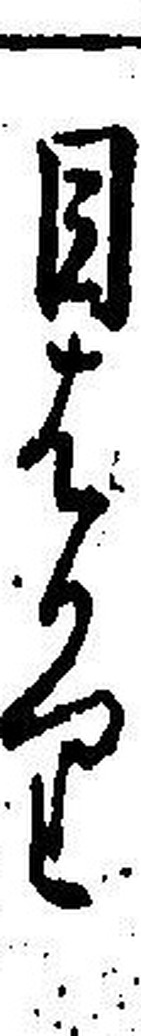目はかり
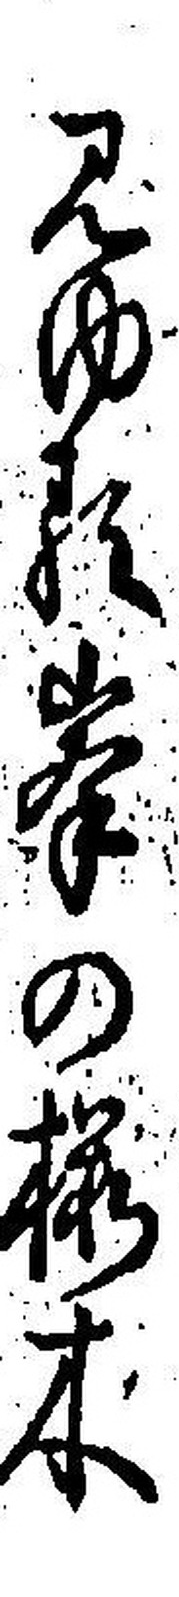見ゆる峯の桜木

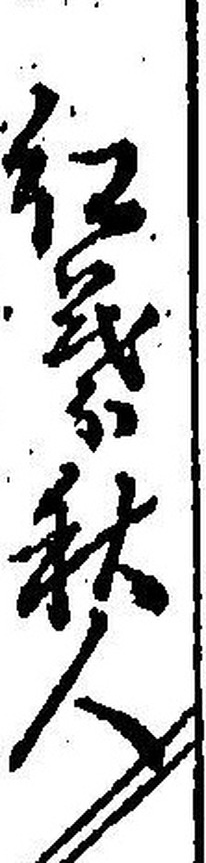紅葉秋人
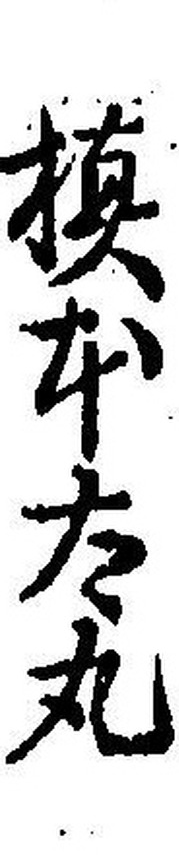槙本太丸
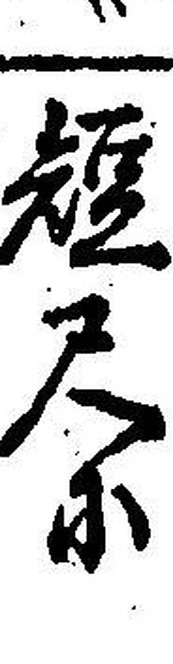短尺に
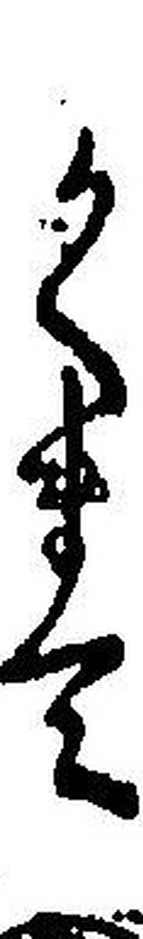かくまて
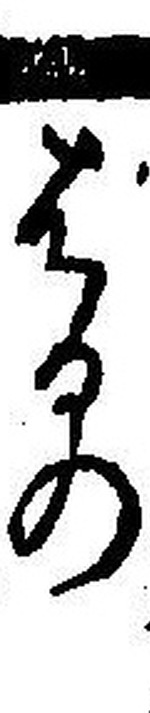はるの
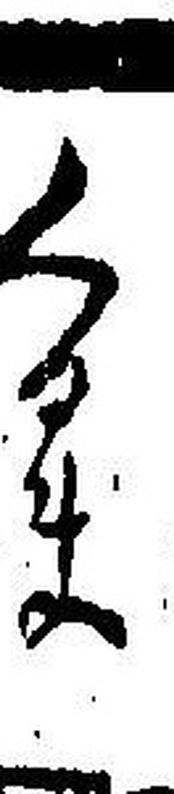くるま
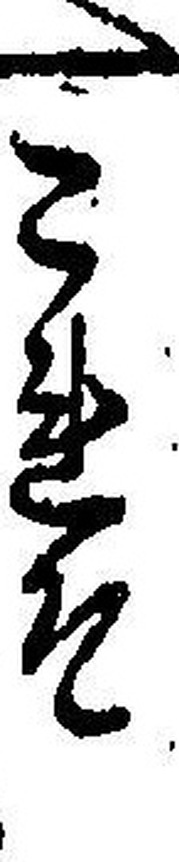これそ
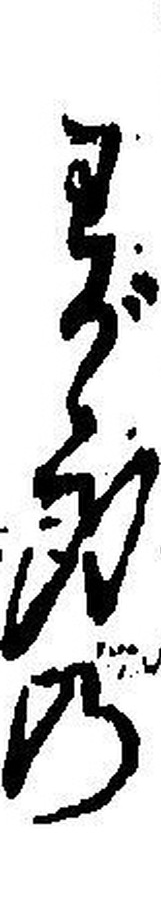わが身の
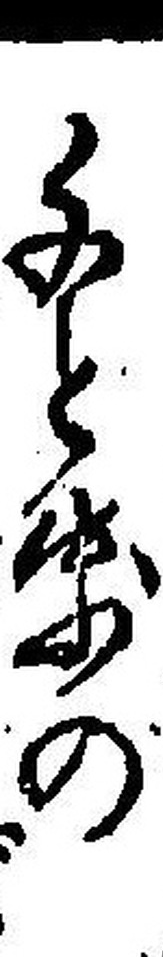千とせの
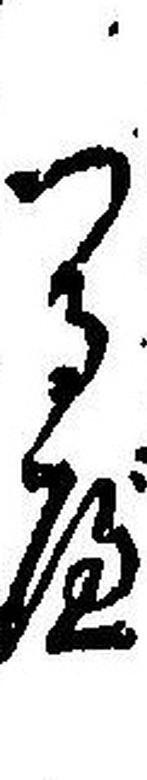つるべ
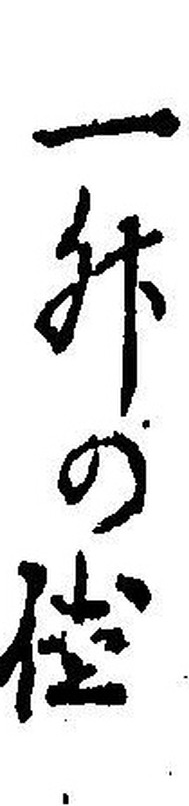一升の徳
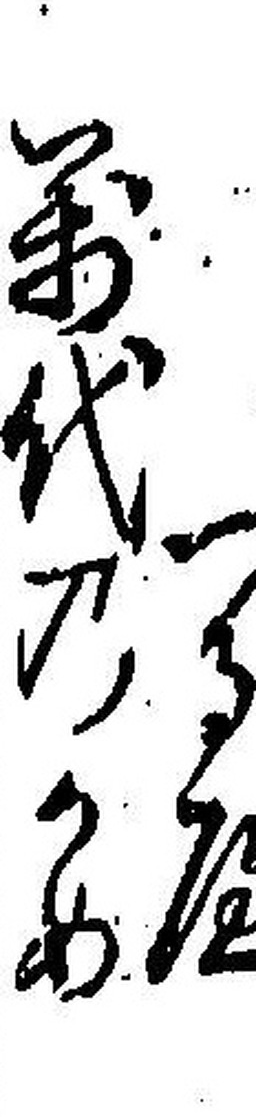万代のかめ
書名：どうれ百人一首 / 鹿都部真顔(狂歌堂)編
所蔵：東京大学総合図書館 General Library in the University of Tokyo, JAPAN
